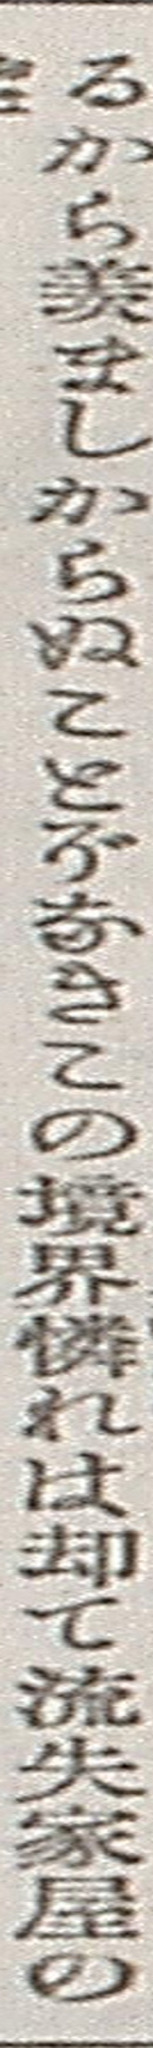るから羨ましからぬことぞなきこの境界憐れは却て流失家屋の
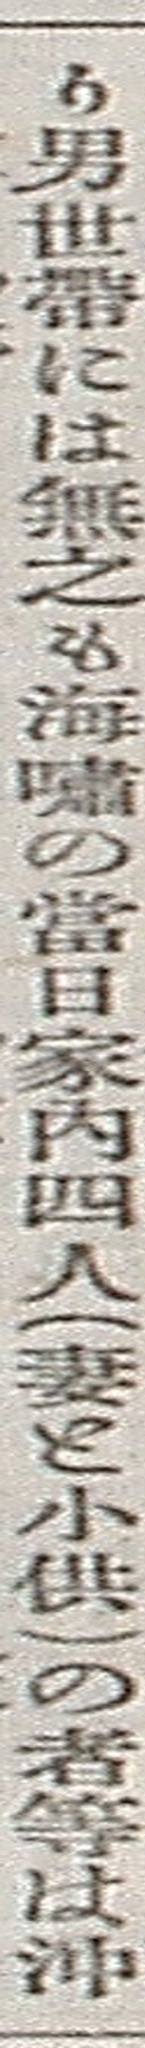り男世帯には無之も海嘯の当日家内四人の者等は沖
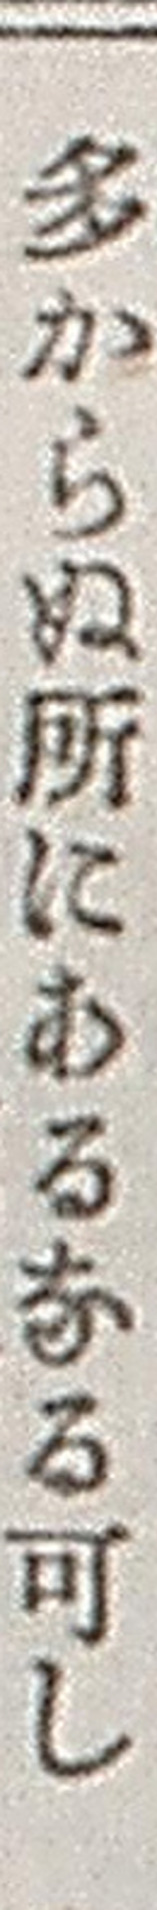多からぬ所にあるなる可し
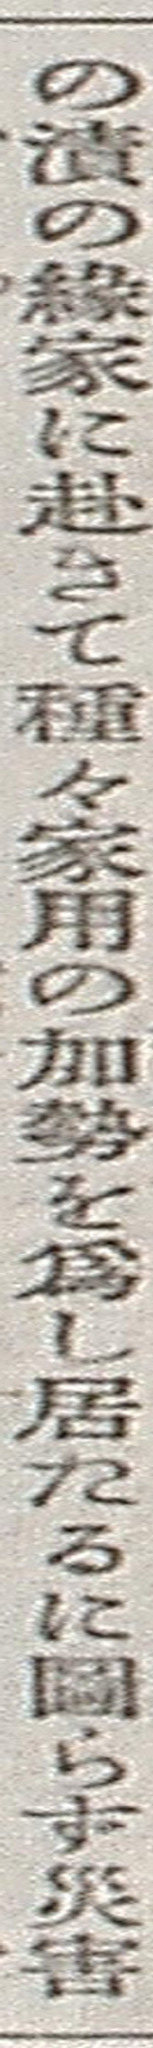の漬の縁家に赴きて種々家用の加勢を為し居たるに図らず災害
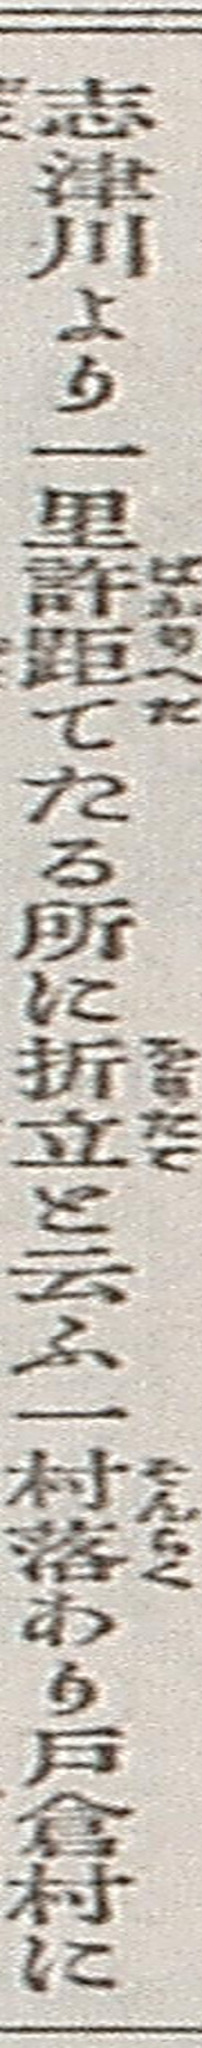志津川より一里許距てたる所に折立と云ふ一村落あり戸倉村に
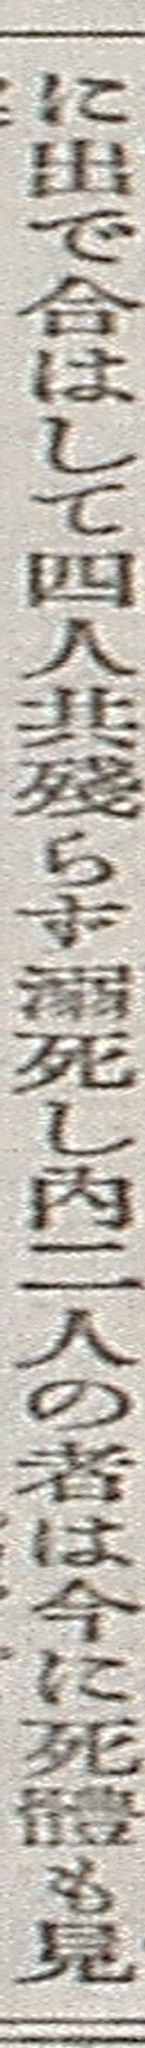に出で合はして四人共残らず溺死し内二人の者は今に死体も見
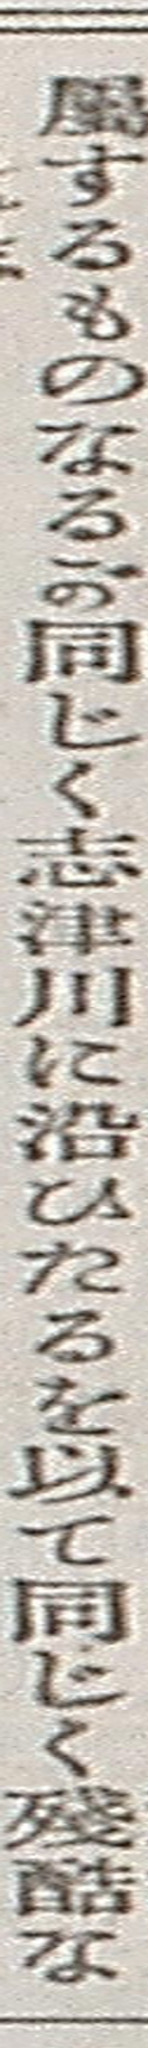属するものなるが同じく志津川に沿ひたるを以て同じく残酷な
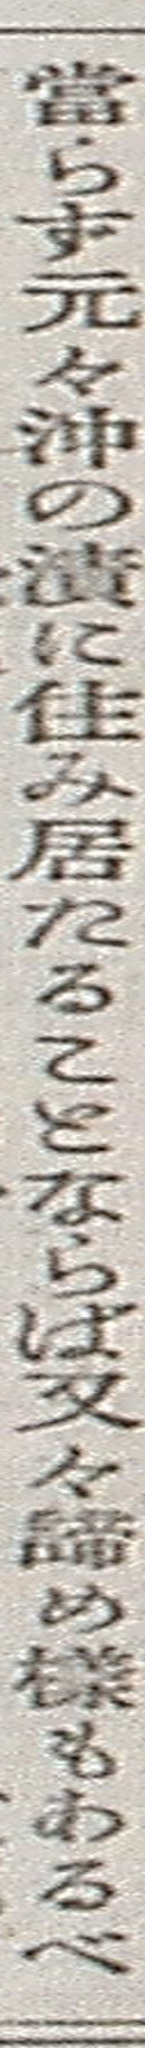当らず元々沖の漬に住み居たることならば又々諦め様もあるべ
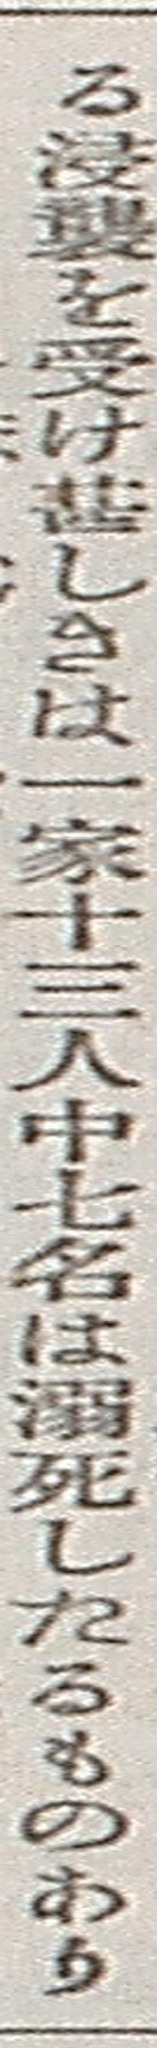る浸襲を受け甚しきは一家十三人中七名は溺死したるものあり
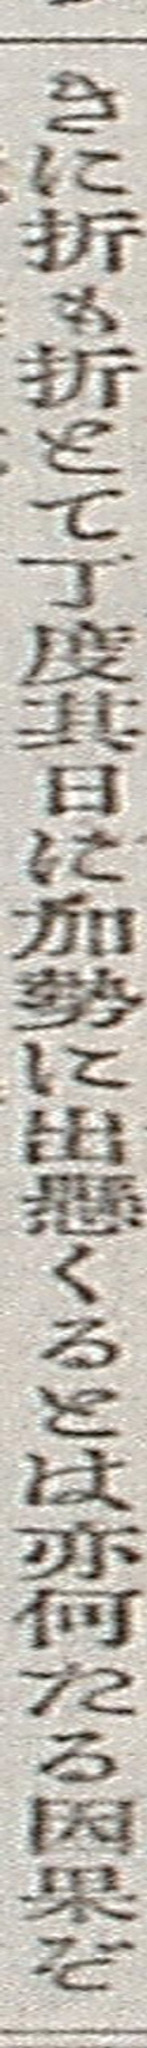きに折りも折とて丁度其日に加勢に出懸くるとは亦何たる因果ぞ
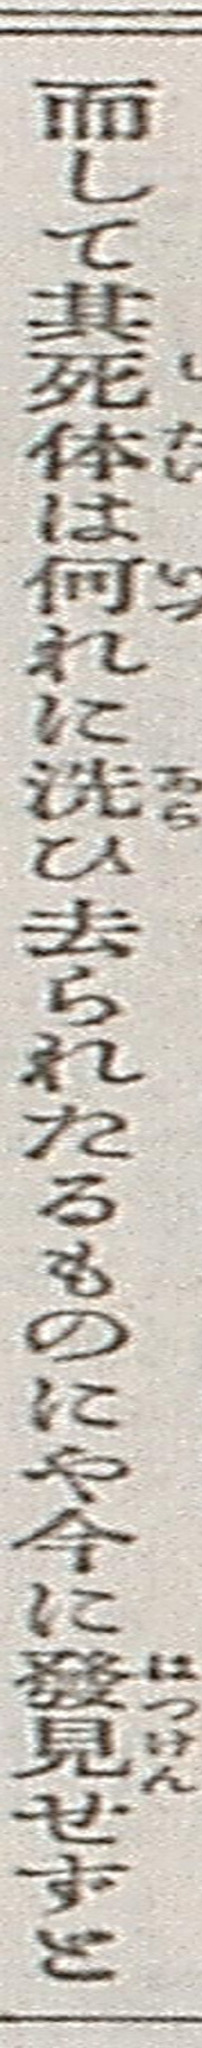而して其死体は何れに洗ひ去られたるものにや今に発見せずと
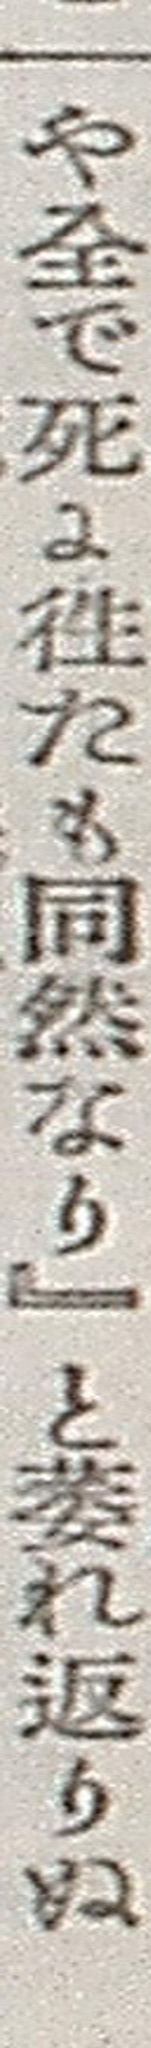や全で死に往たも同然なり』と萎れ返りぬ
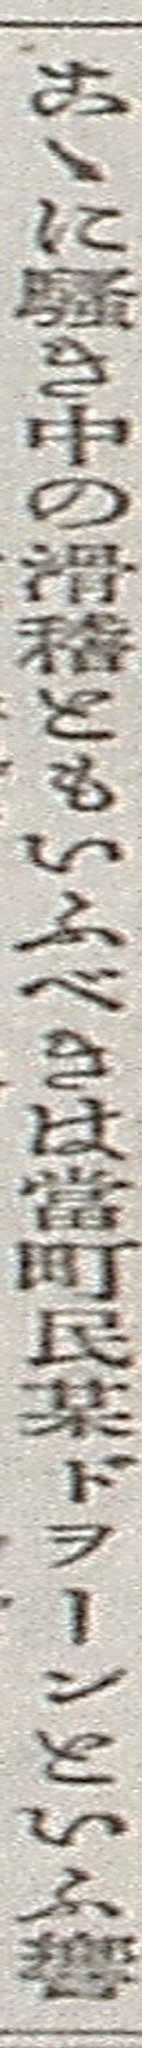こゝに騒き中の滑稽ともいふべきは当町民某ドヲーンといふ響
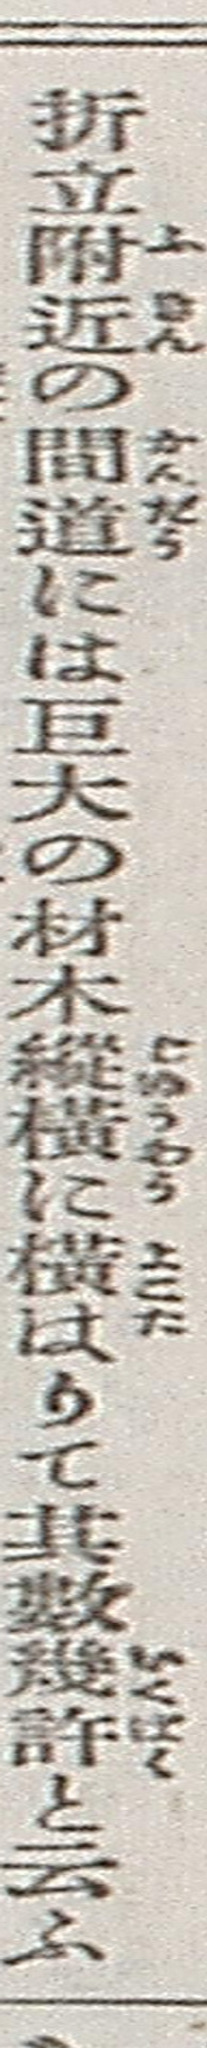折立付近の間道には巨大の材木縦横に横はりて其数幾許と云ふ
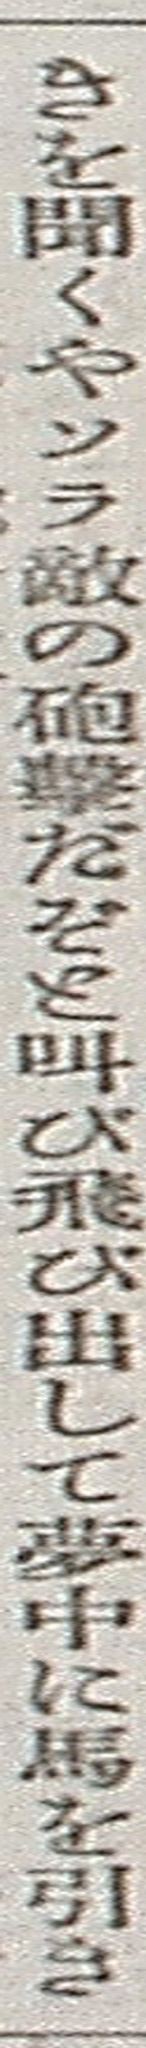きを聞くやそら敵の砲撃だぞと叫び飛び出して夢中に馬を引き
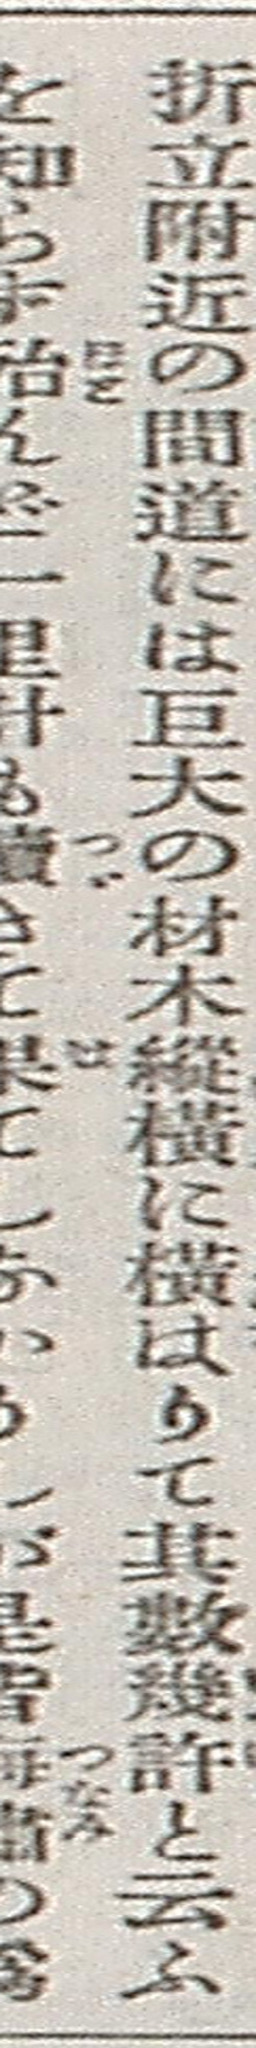を知らず殆んど一里計も続きて果てしなかりしが是皆海嘯の為
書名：風俗畫報臨時増刊第百十九號　大海嘯被害録（中）
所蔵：東京大学地震研究所図書室 Earthquake Research Institute Library, The University of Tokyo, JAPAN
